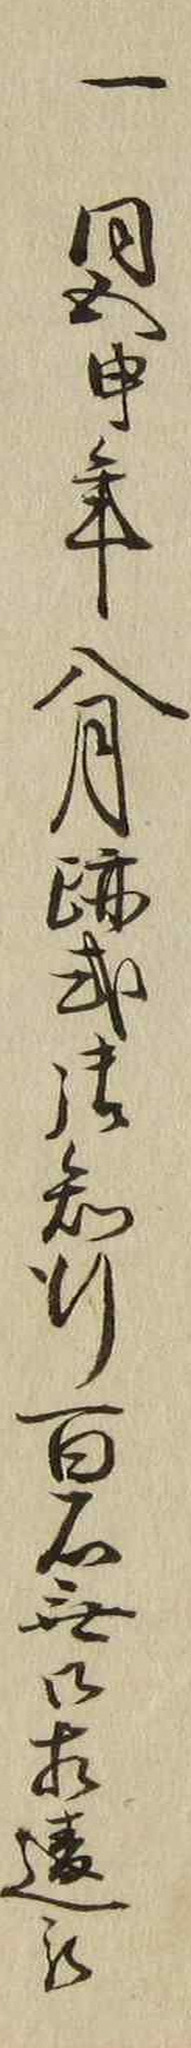一同五申年八月跡式御知行百石無御相違被
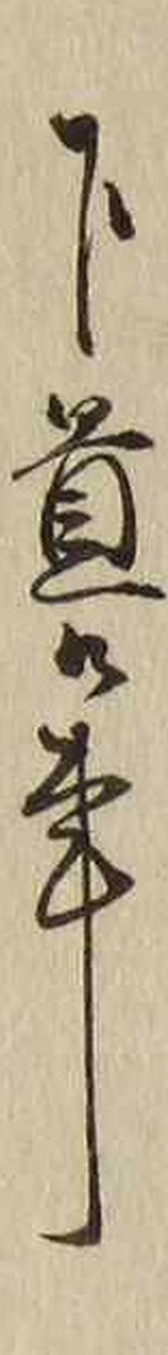下置候事
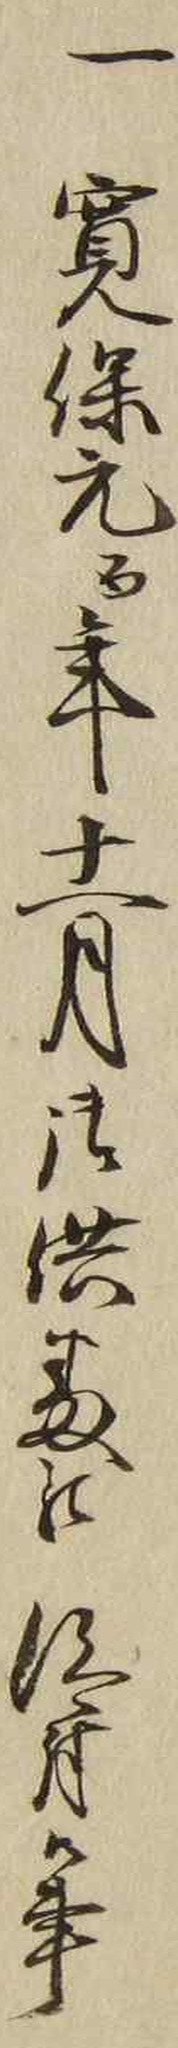一寛保元酉年十一月御供番被仰付候事
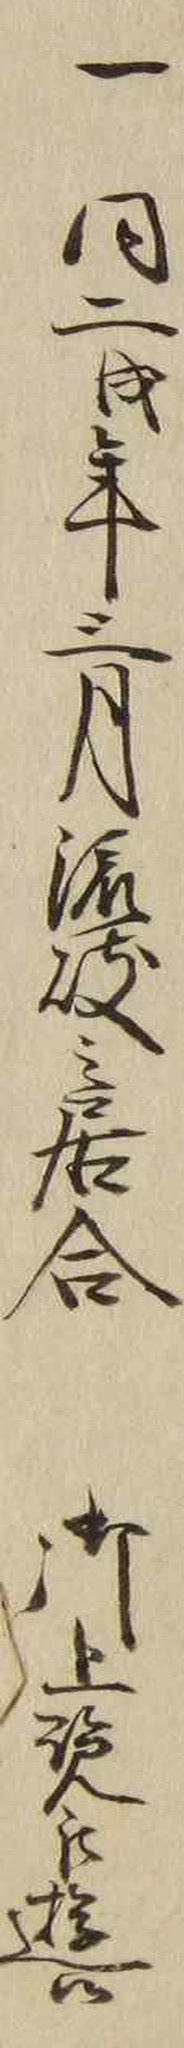一同二戌年三月流岐之居合御上覧被遊候

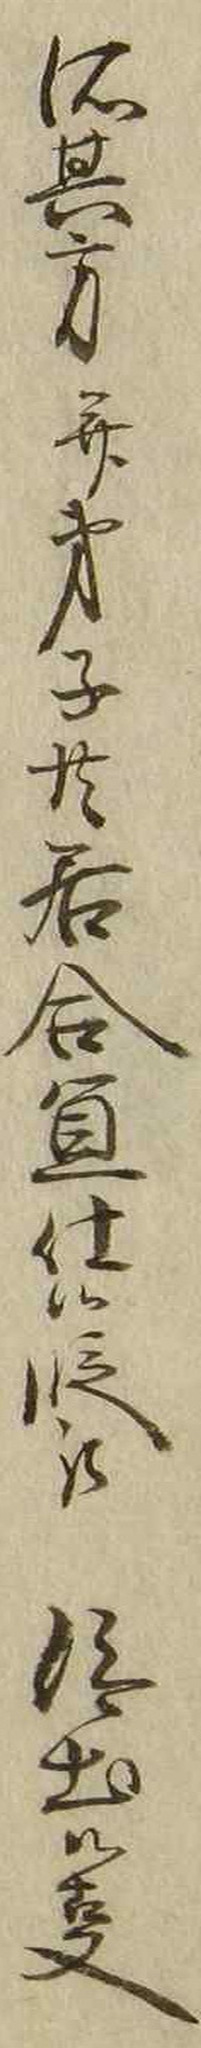所其方并弟子共居合宜仕候段被仰出候事
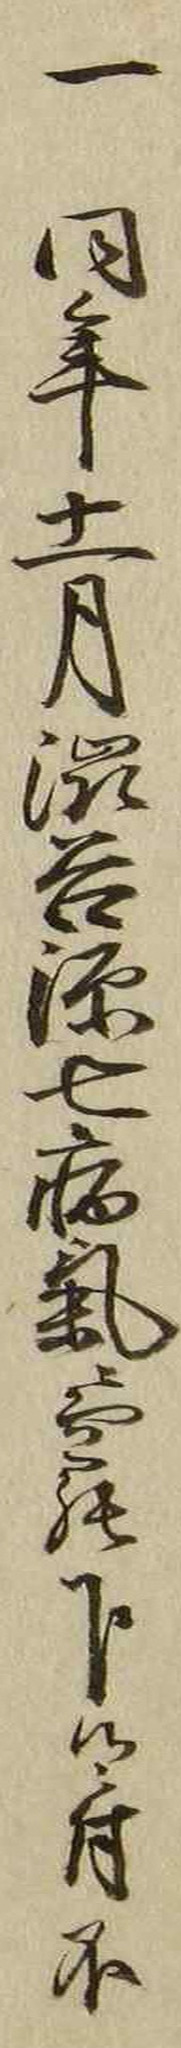一同年十一月渋谷源七病気に而罷下候に付不
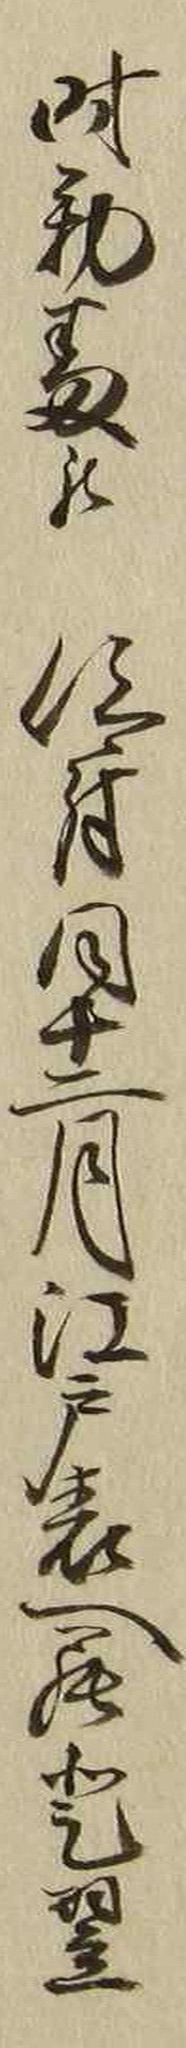時勤番被仰付同十二月江戸表へ罷登翌
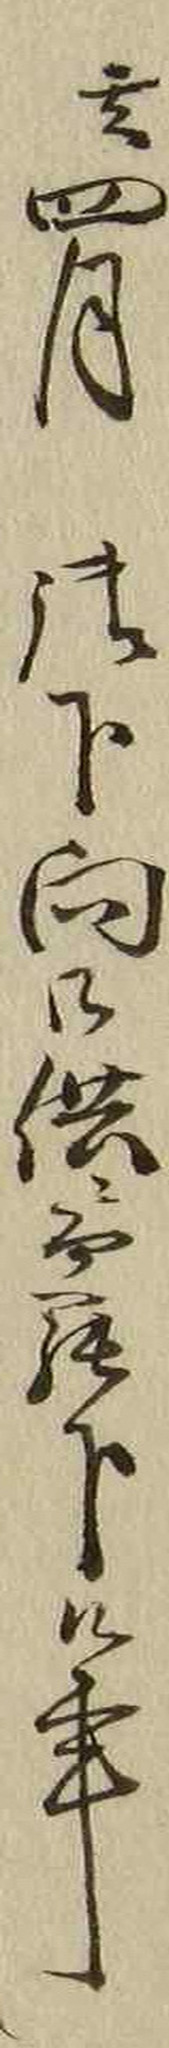亥四月御下向御供に而罷下候事
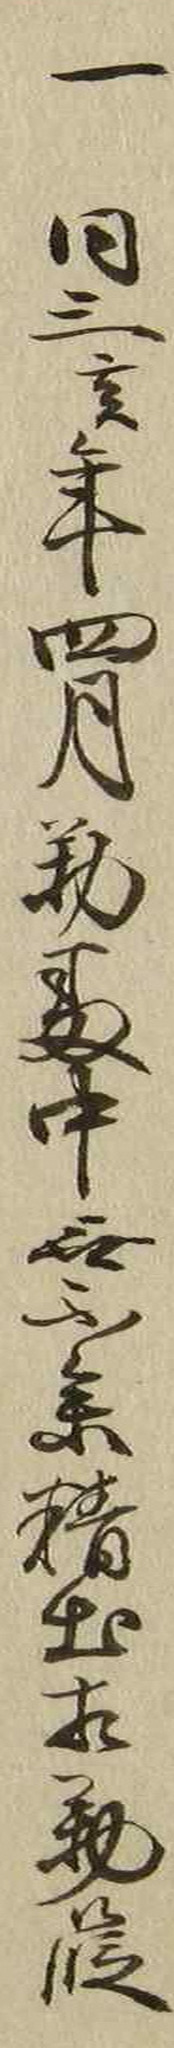一同三亥年四月勤番中無不参精出相勤候段
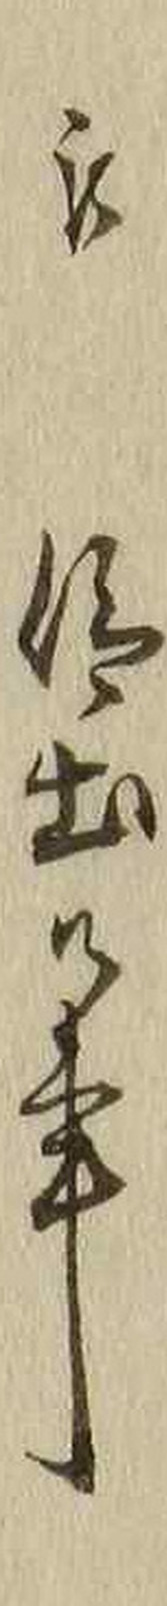被仰出候事
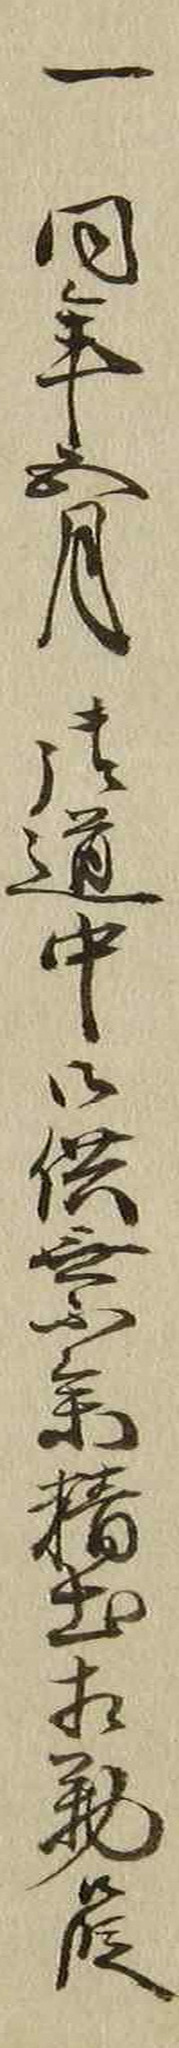一同年五月御道中御供無不参精出相勤候段
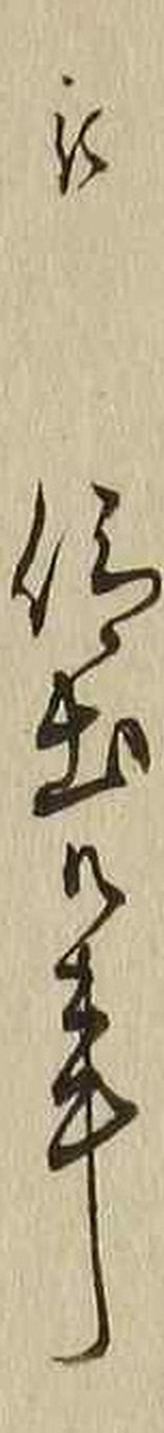被仰出候事
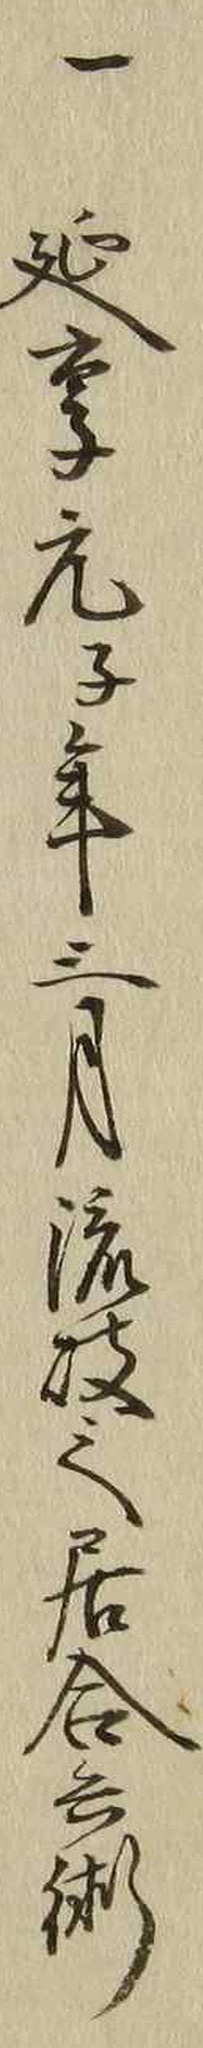一延享元子年三月流岐之居合兵術
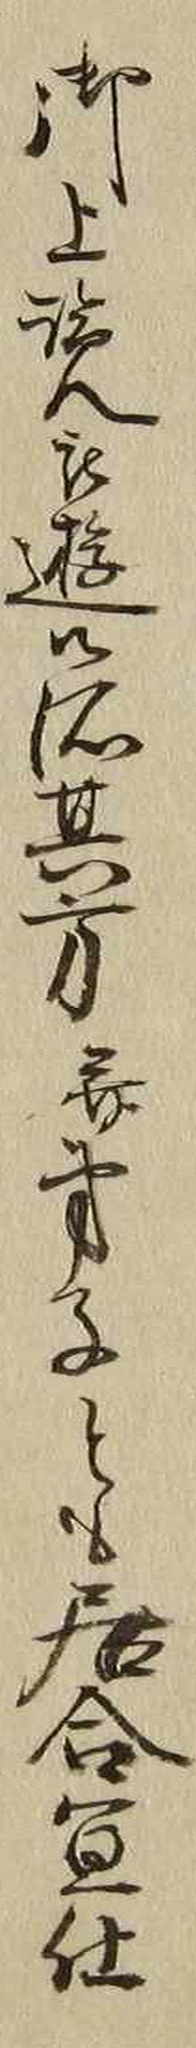御上覧被遊候所其方并弟子とも居合宜仕
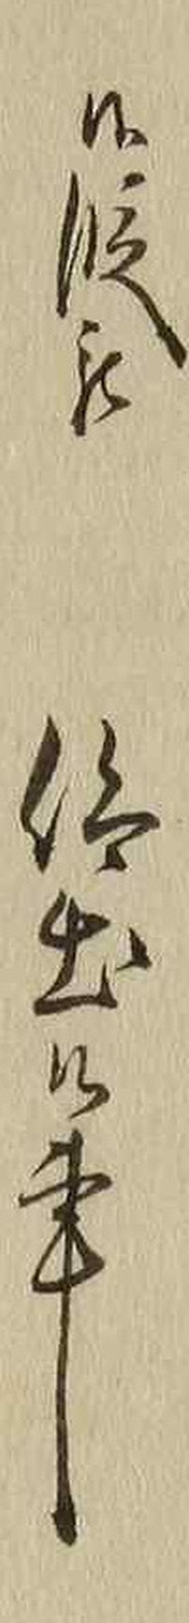候段被仰出候事
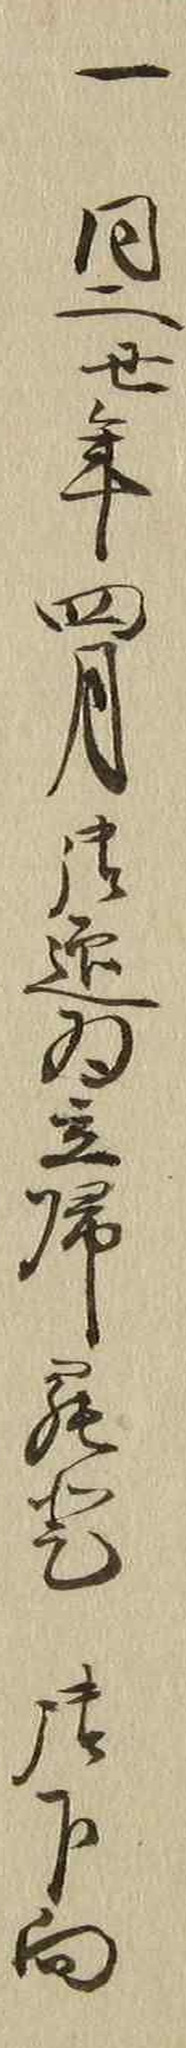一同二丑年四月御迎為立帰罷登御下向
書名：諸士系譜　巻之67　を之部1
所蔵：会津若松市立会津図書館
